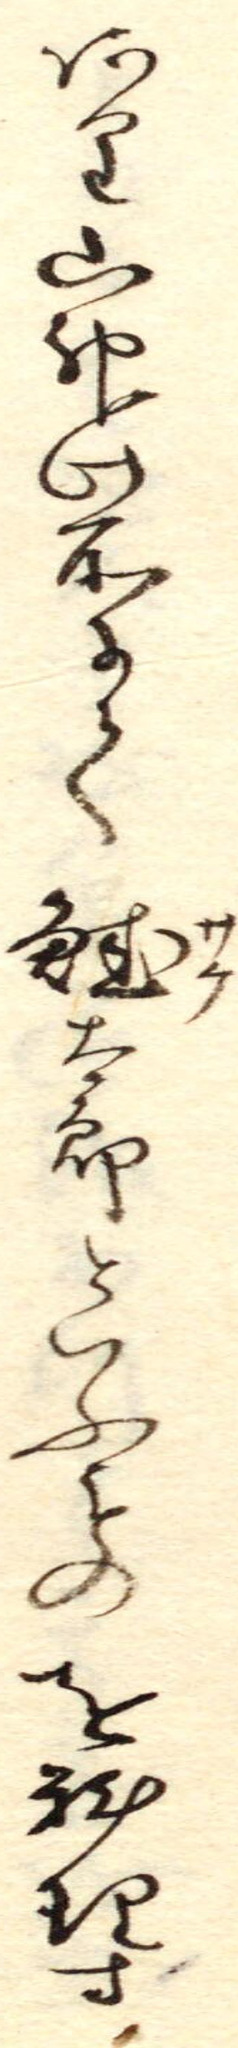あり山神此所にて鮭太郎といふものを料理す
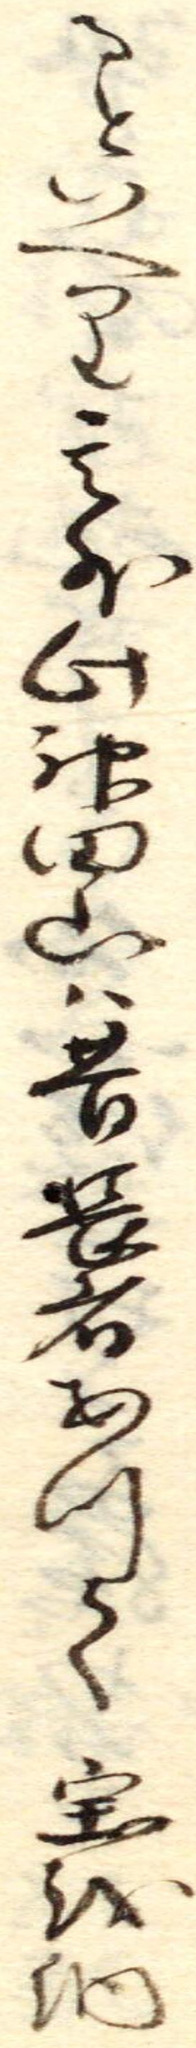るといへり其外神田山は昔長者あつて宝を納
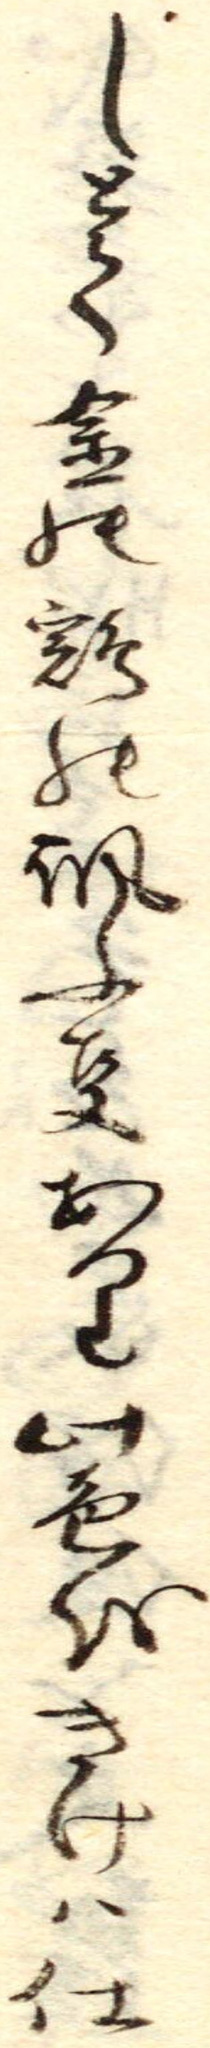しとて金の鶏の諷ふ事あり此色をきけは仕
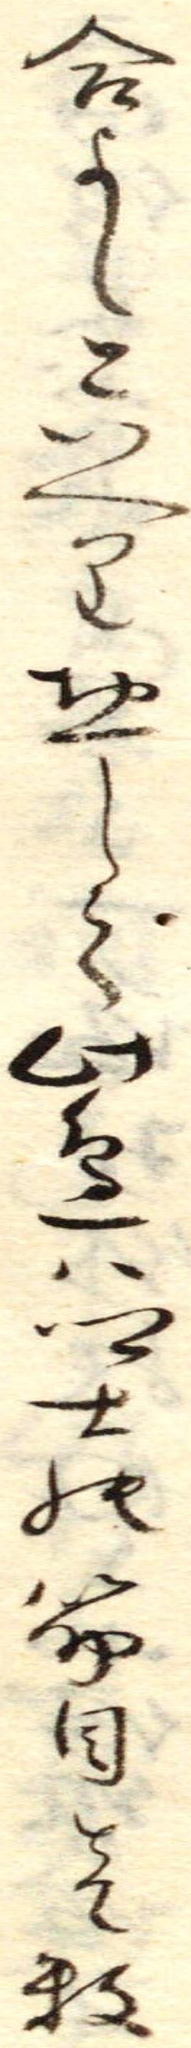合よしといへり惣して此辺は郷士の筋目とて数
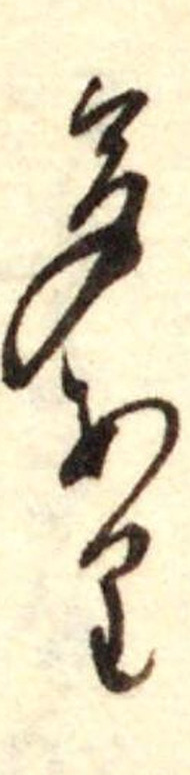多あり

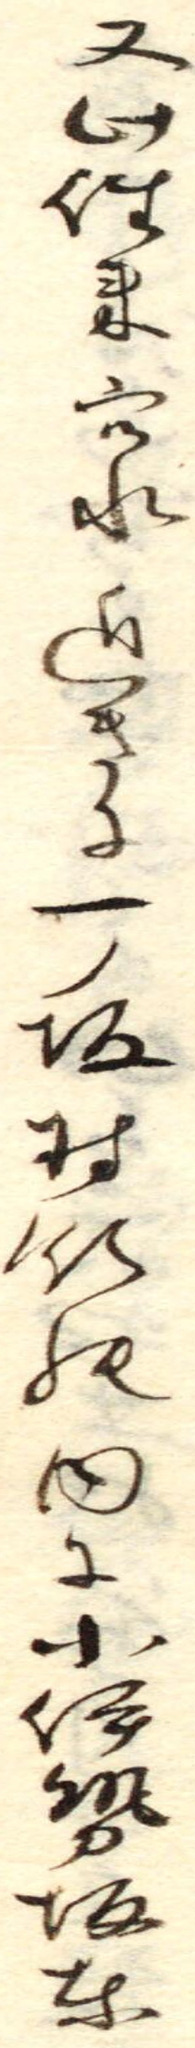又此往来穴水近きに一ノ坂村領の内に小伊勢坂東
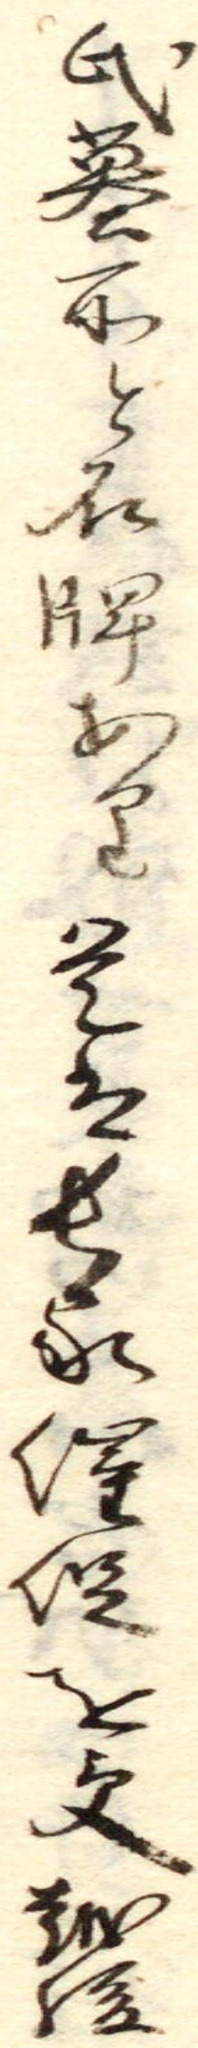氏墓所と名牌あり是は長家催促を受越後
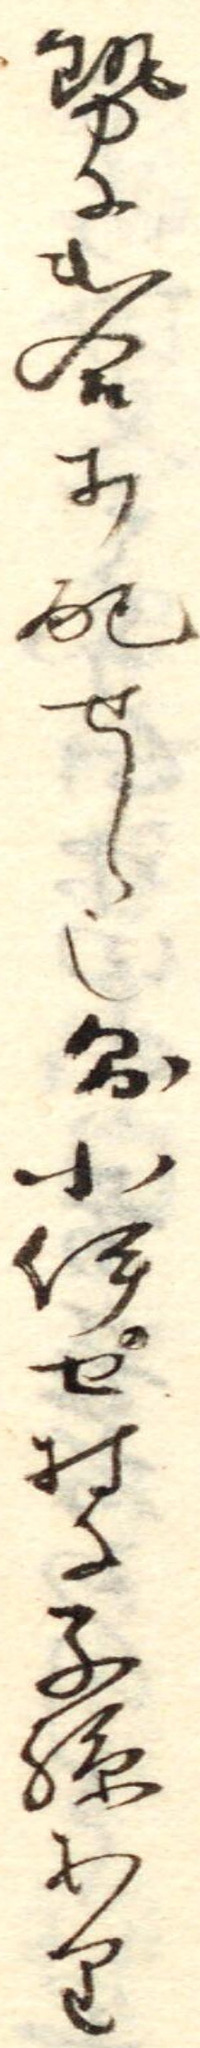勢に出合相拝配せし也則小伊勢村に子孫あり
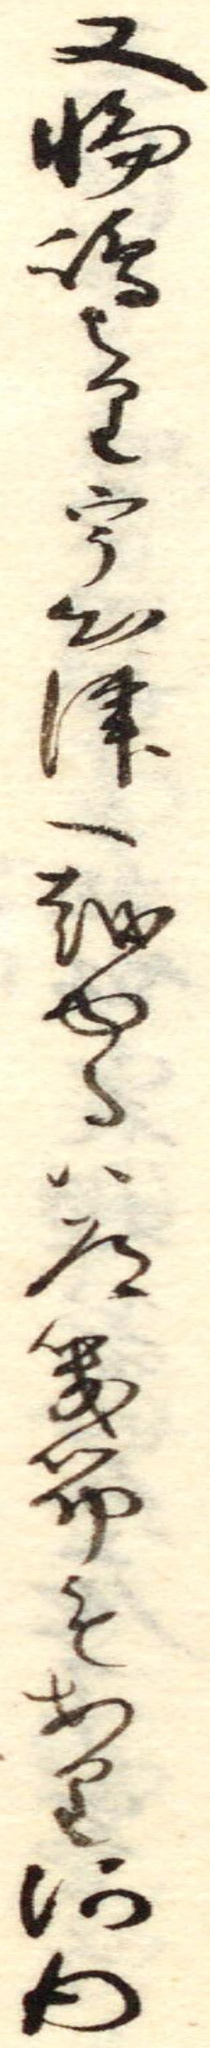又輪嶋より宇出津へ越ゆるは道幾筋もあり河内
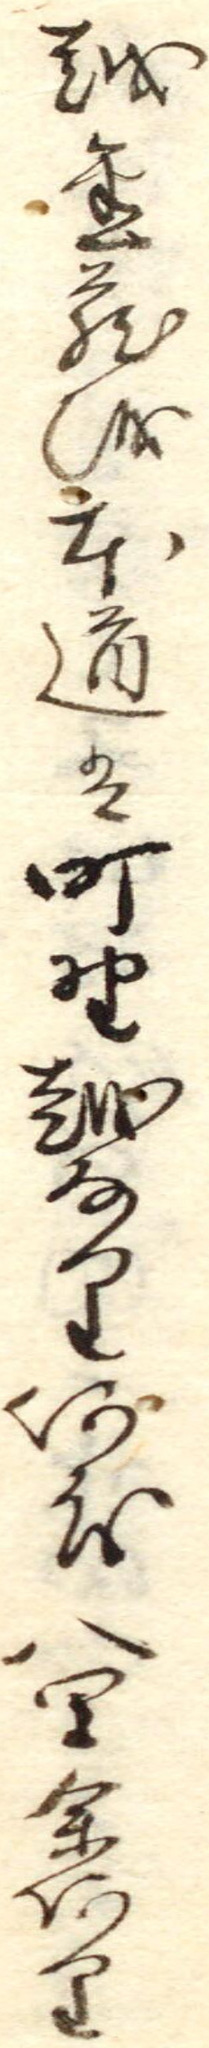越金蔵越本通は町野越なり何も八里余あり
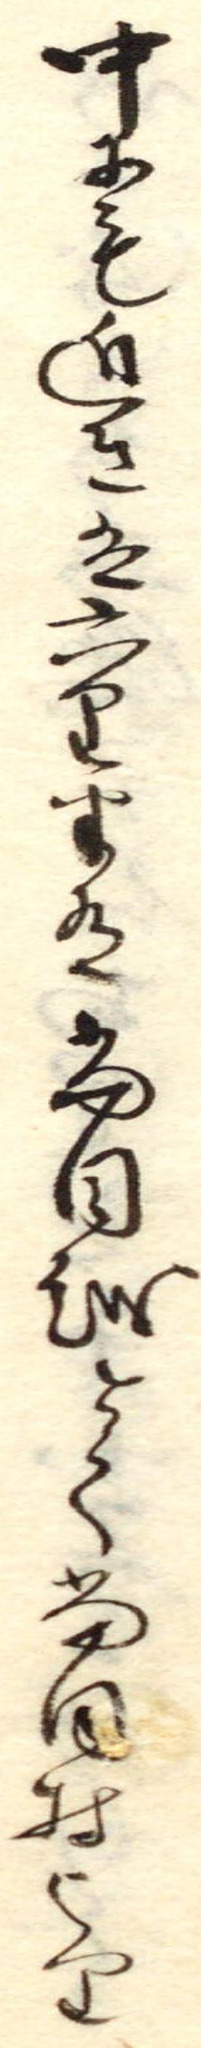中にも近きは六里半有当目越とて当目村より
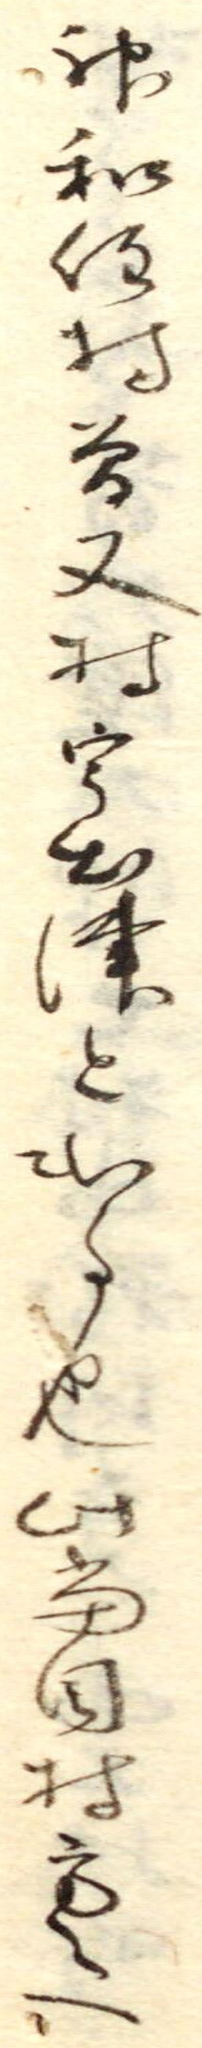神和住村曽又村宇出津と出る也此当目村方へ一
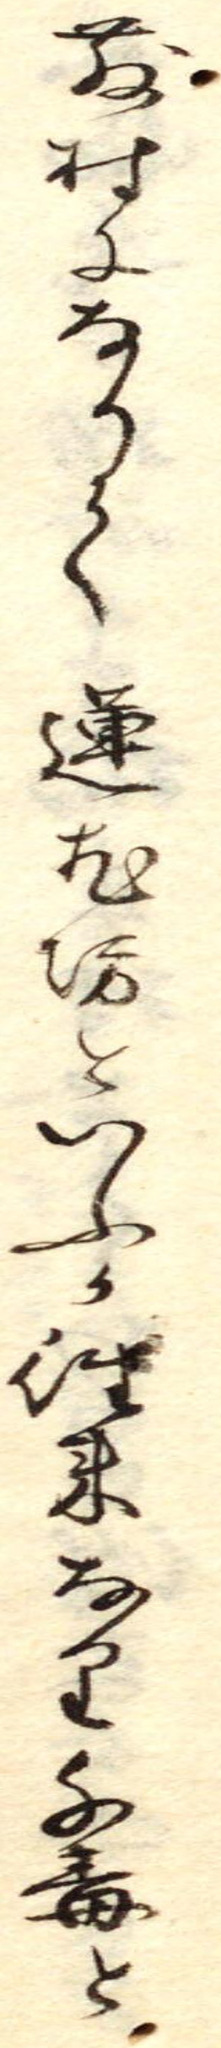散村になりて蓮尤坊といふか往来なり千毒と
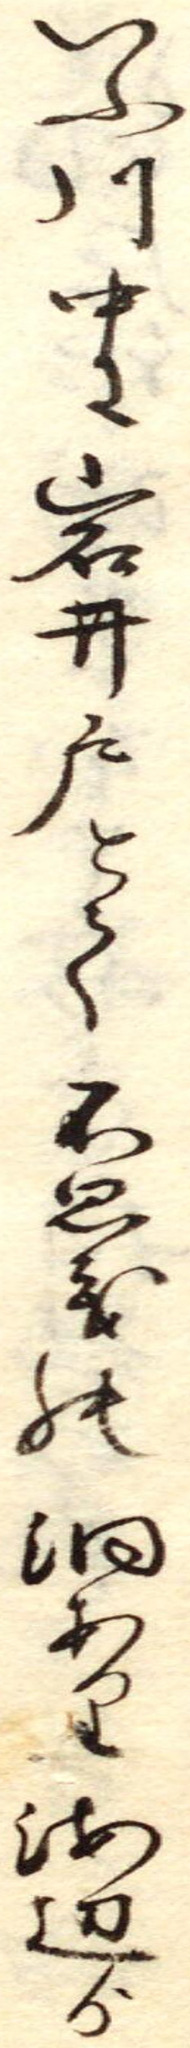いふ川中に岩井戸とて不思義の洞あり海辺ゟ
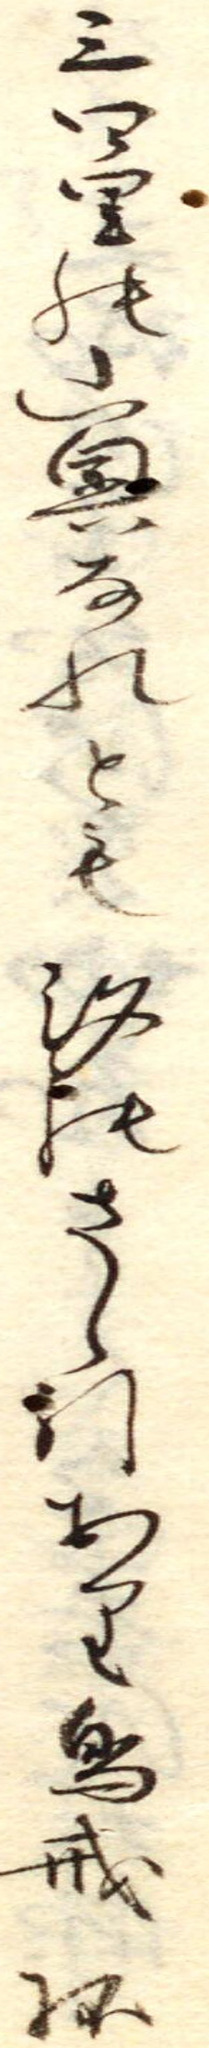三四里の山奥なれとも汐のさし引あり烏戒抔
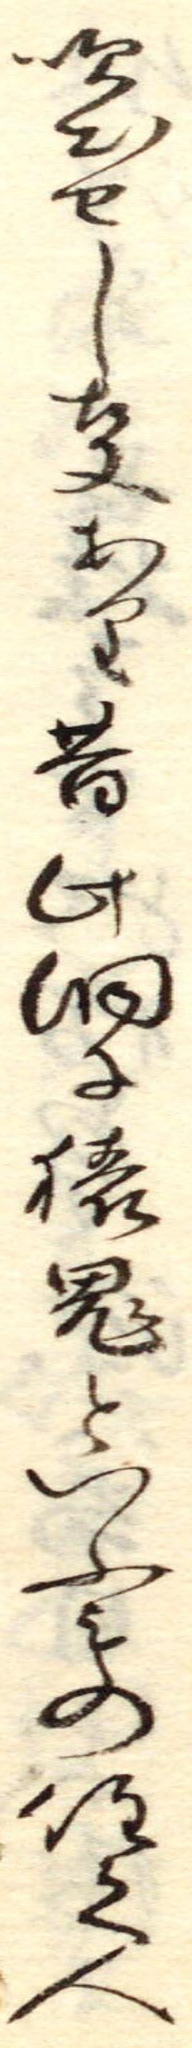吹出せし事あり昔此洞に猿鬼といふもの住て人
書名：能登名跡誌
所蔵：Ishikawa Prefectural Library
